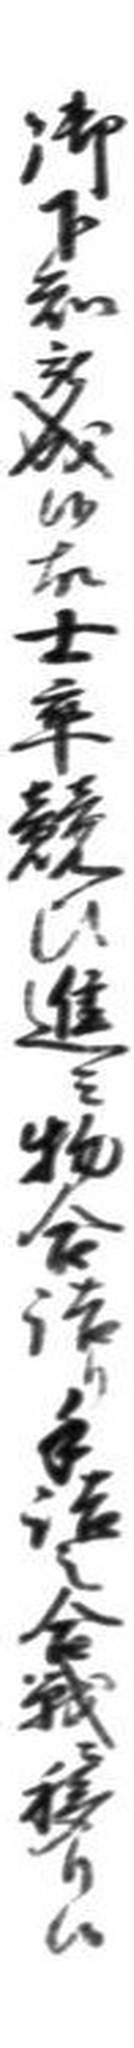御下知被成候故仕卒競ひ進み物合詰り手詰之合戦ニ移り候
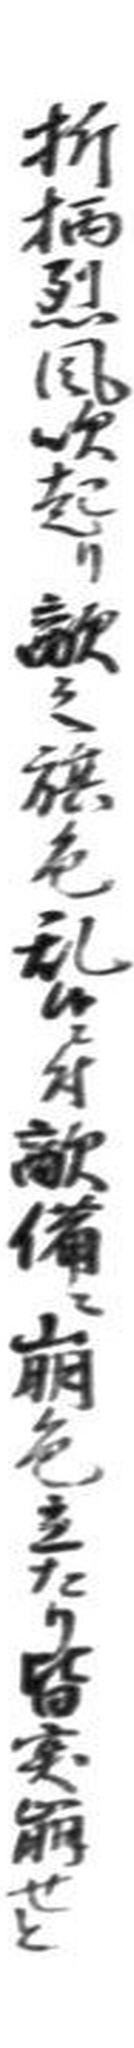折柄烈風吹起り敵之旗色乱候ニ付敵備ニ崩色立たり皆突崩せと

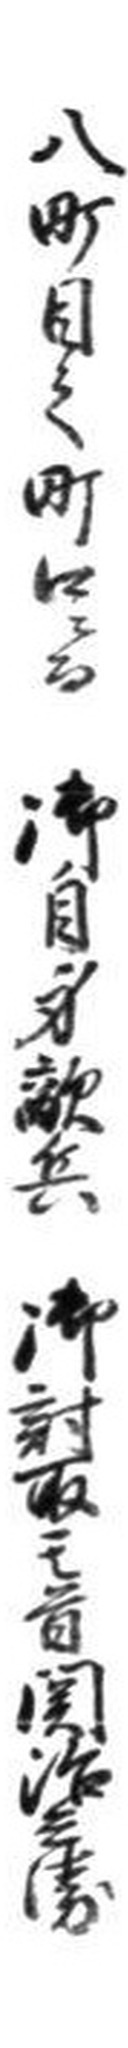八町目之町口ニ而御自身敵兵御討取其首関治兵衛
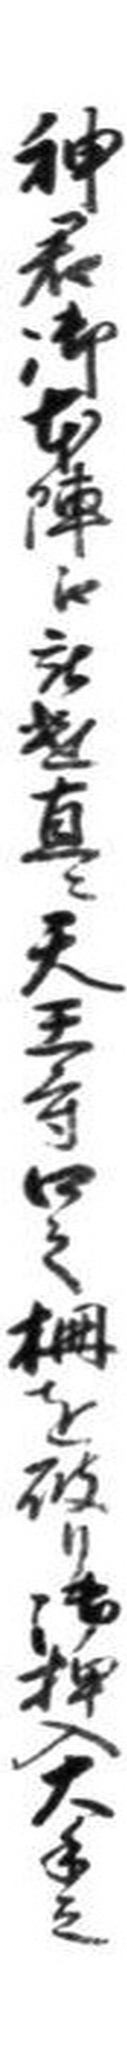神君御本陣江被遣直ニ天王寺口之柵を破り御押入大手之
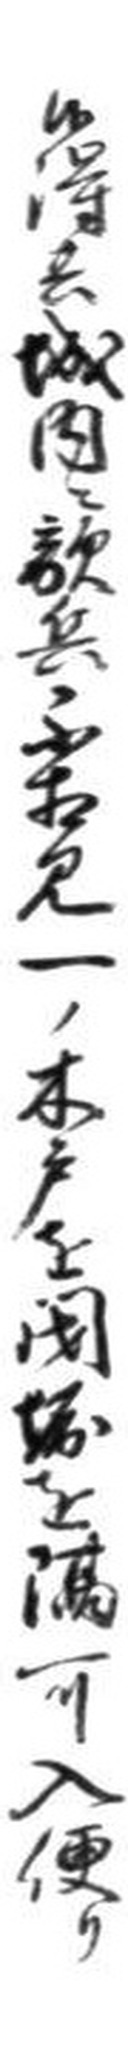候得共城内ニ敵兵不相見一ノ木戸を閉堀を満可入便り
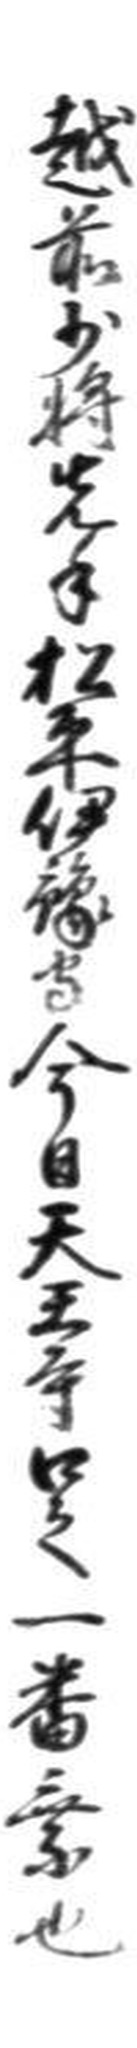越前少将先手松平伊予守今日天王寺口之一番乗也
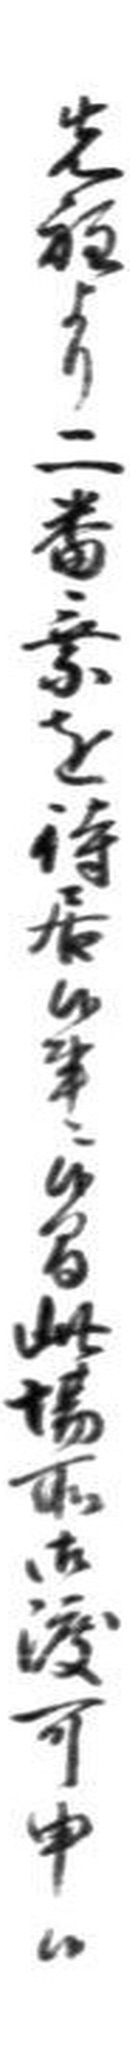先程より二番乗を待居候事ニ候間此場所御渡可申候
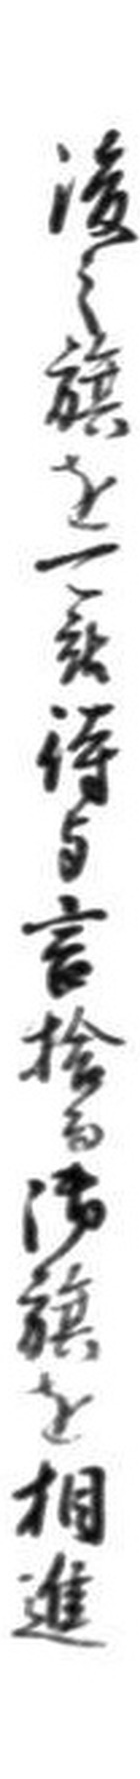後之旗を可被待と言捨而御旗を相進
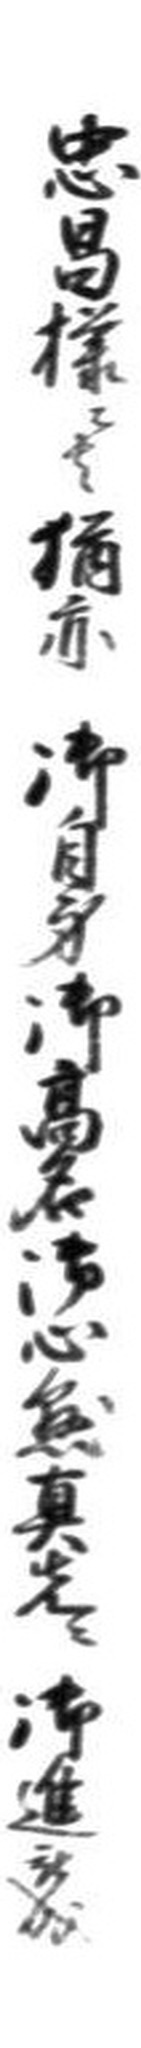忠昌様ニ者猶亦御自身御高名御心懸真先ニ御進被成
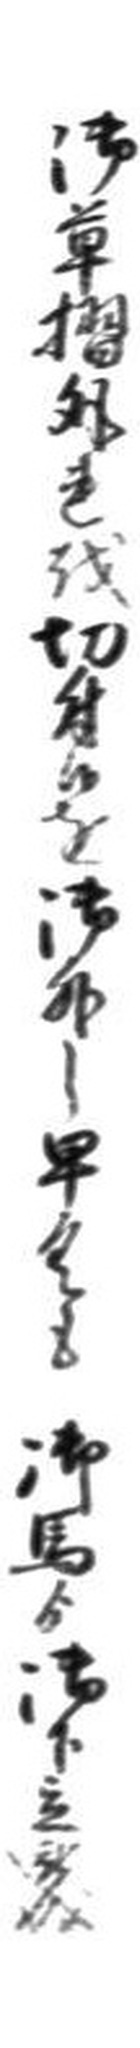御草摺外れを切付候を御外し早くも御馬ゟ御下立被成
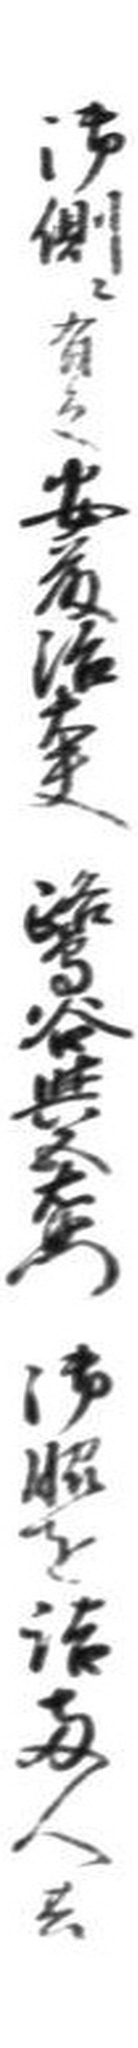御側ニ有之安藤治大夫鷺谷與五右衛門御脇を詰両人共

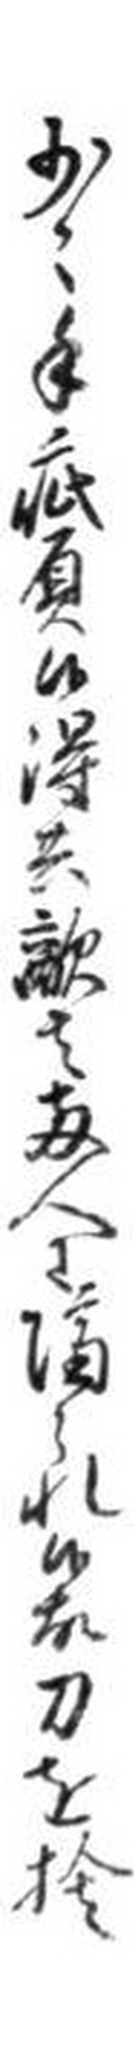少々手疵負候得共敵は両人に隔られ候故刀を捨
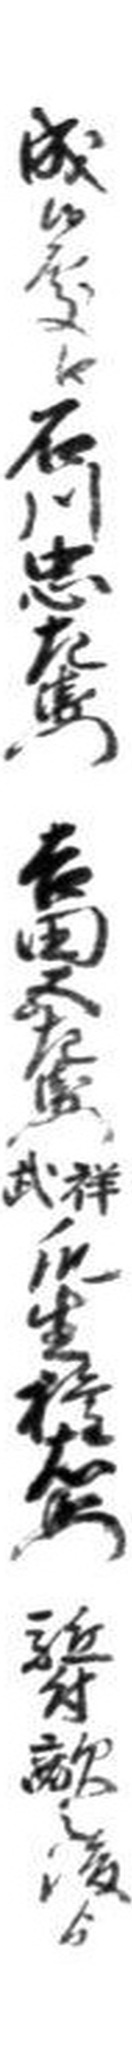成候処江石川忠左衛門吉田五左衛門祥武瓜生権右衛門駈付敵之後ゟ
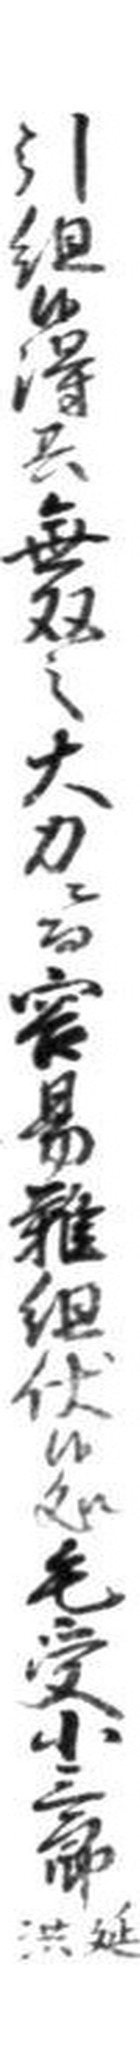引組候得共無双之大力ニ而容易難組伏候処毛受小三郎延洪
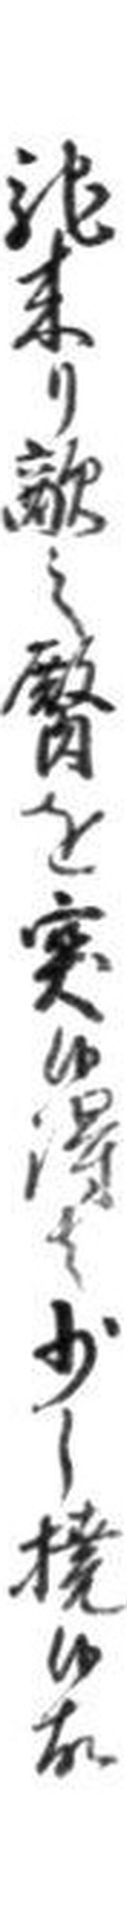馳来り敵之臀を突候得は少し撓候故
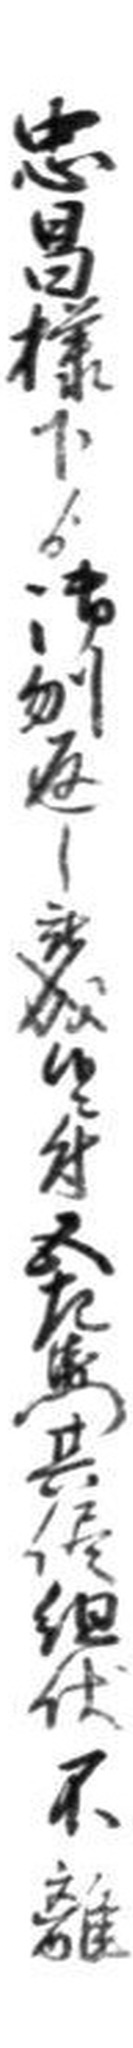忠昌様下ゟ御刎返し被成候ニ付五左衛門其侭組伏不離
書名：家譜 三 忠昌公 従慶長八年到寛永六年
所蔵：福井県文書館 Fukui Prefectural Archives
